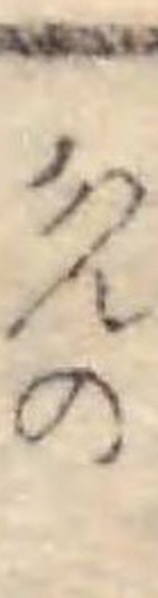ほんの
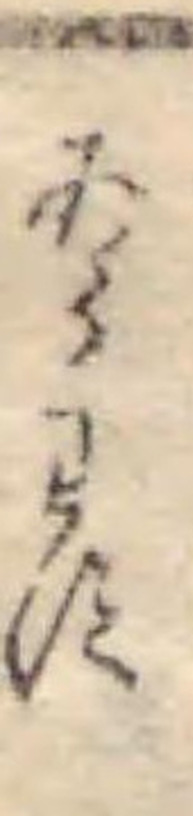あらわす
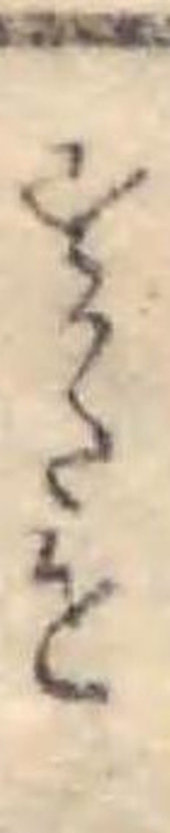すかたを
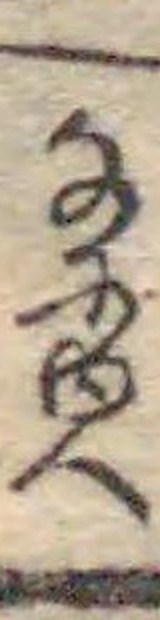なにゆへ
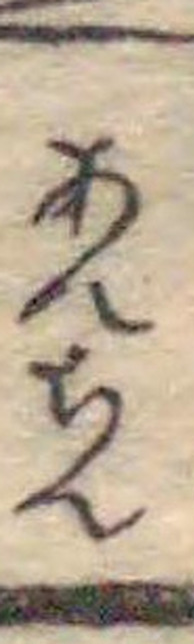あんちん
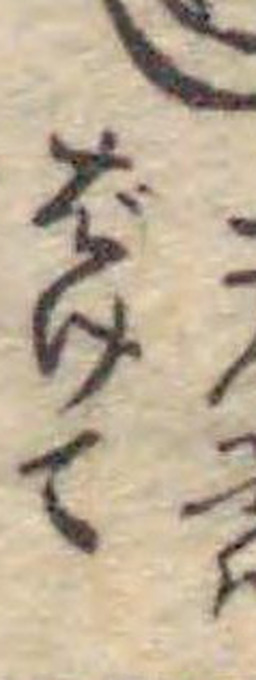ばけて
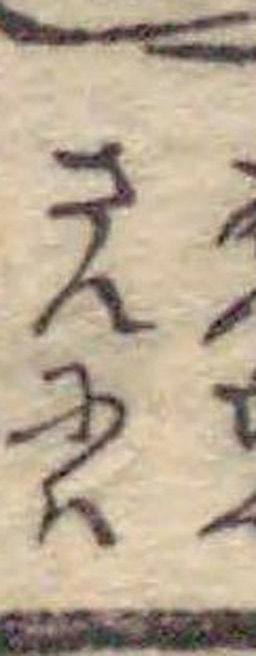さんには
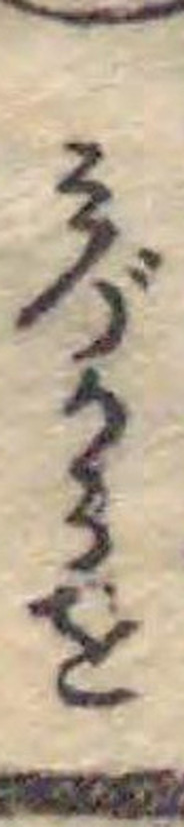みづからを
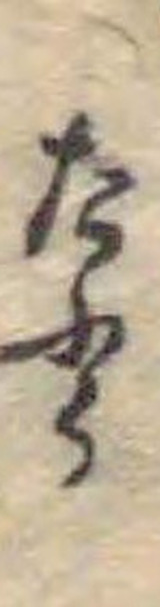たふら
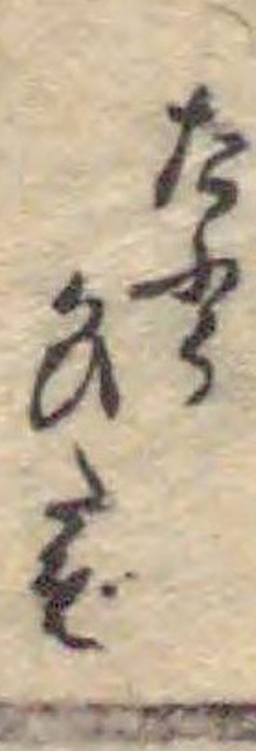かひたぞ
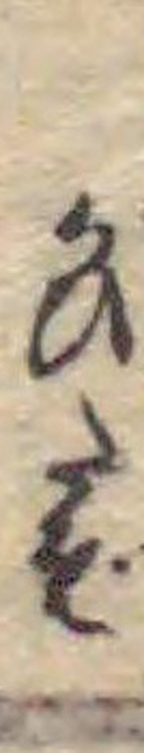かひたぞ
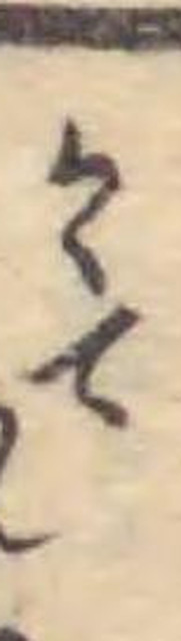かくて
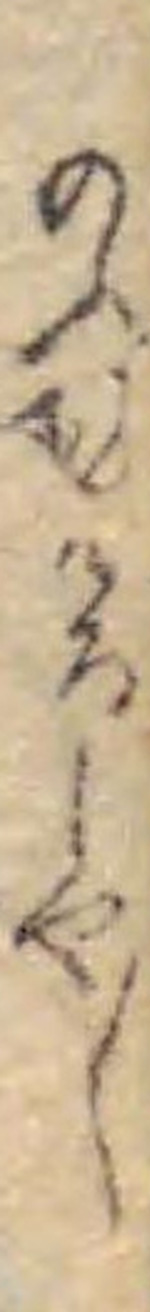のふおそろしや〳〵
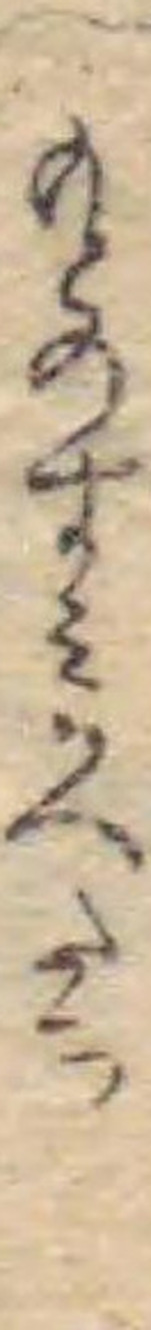もとのすみかへたち
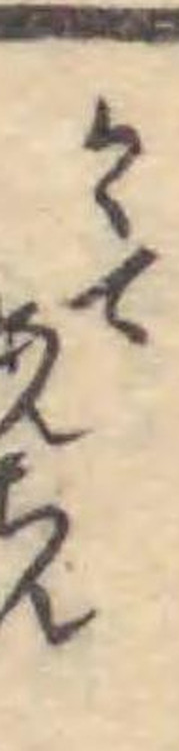あんちん
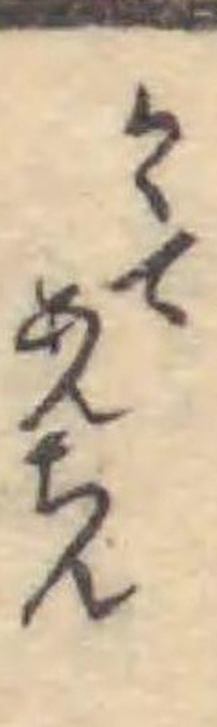あんちん
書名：鐘入七人化粧 : 3巻
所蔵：国立国会図書館 National Diet Library, JAPAN
